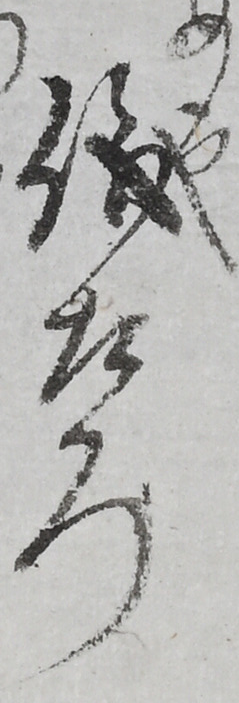儀左衛門
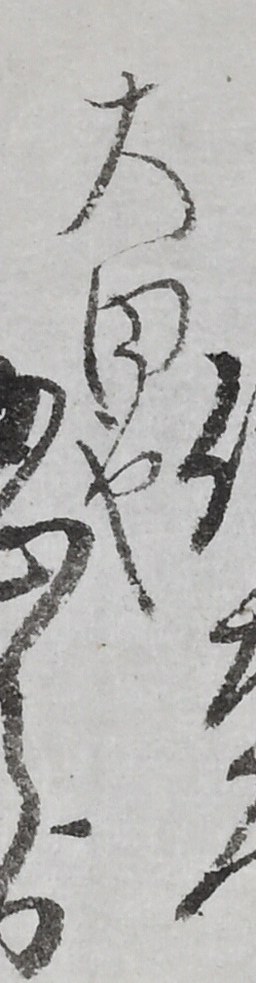大田や
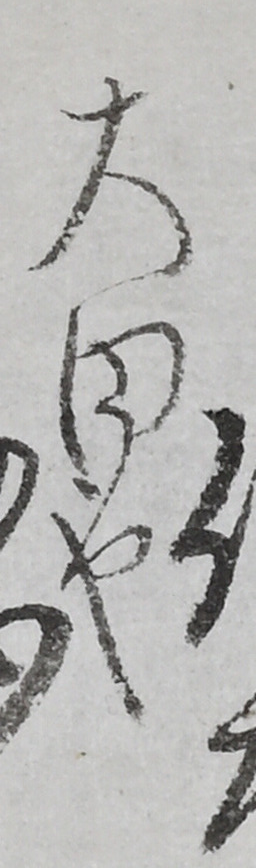大田や
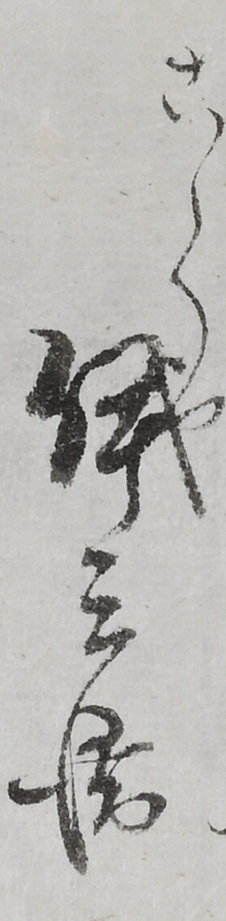伊兵衛
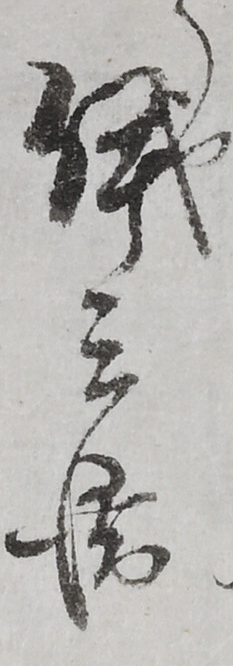伊兵衛
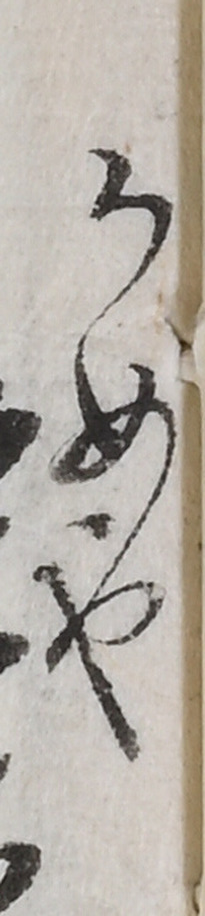かめや
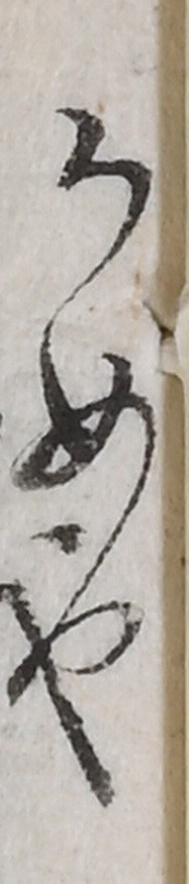かめや
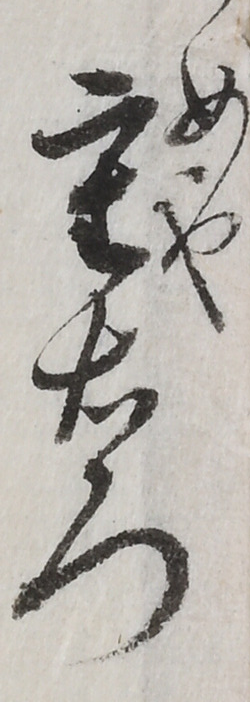忠右衛門
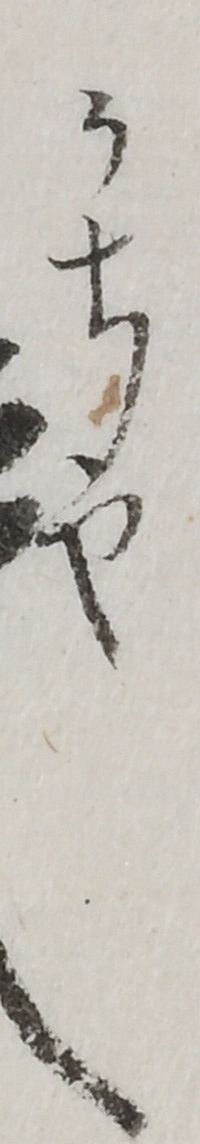うちや
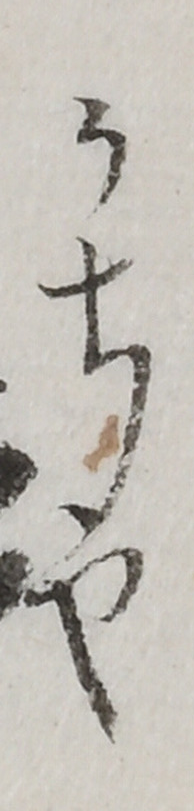うちや
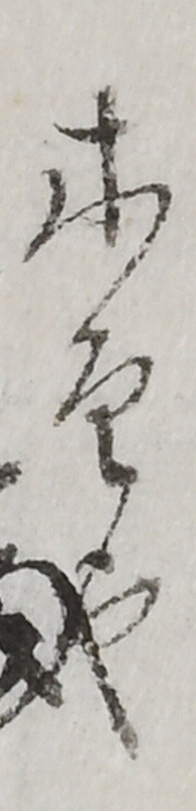木曽や
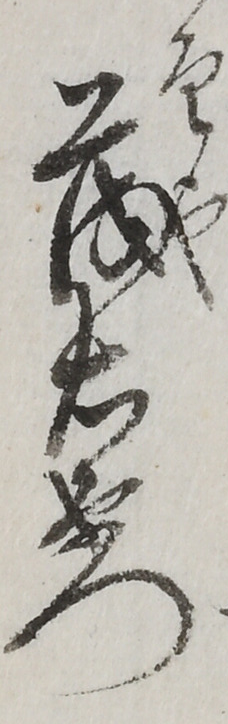茂右衛門
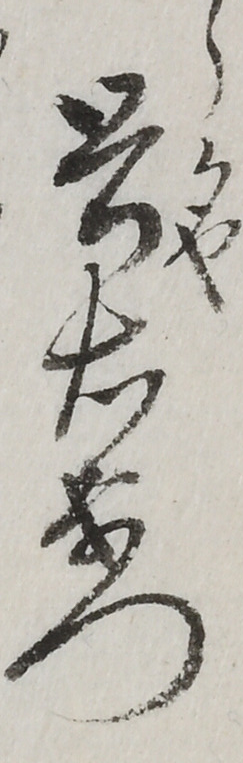忠右衛門
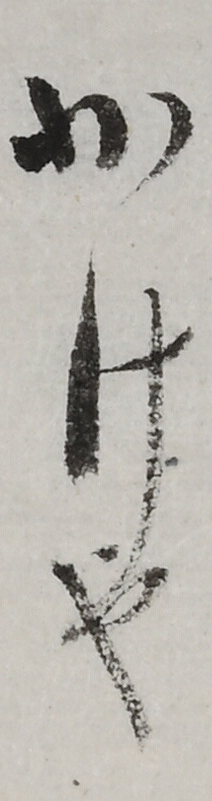かめや
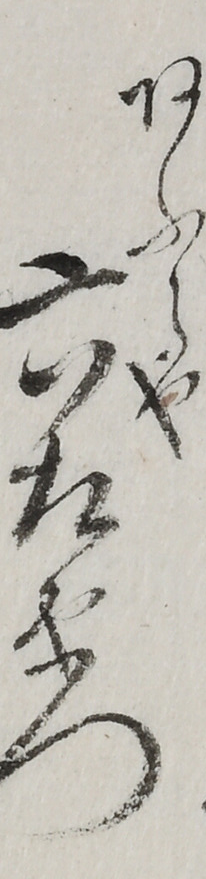六左衛門
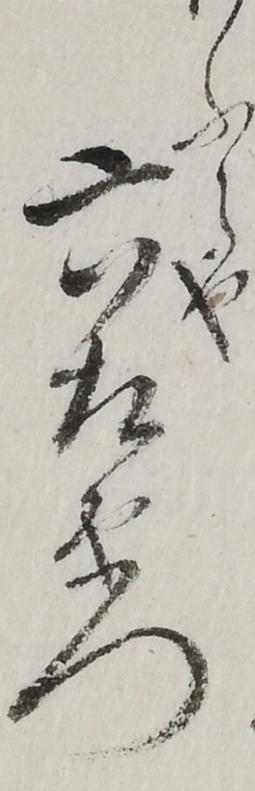六左衛門
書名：當町火消道具幷役附帳
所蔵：伊那市立高遠町図書館・合同会社AMANE
